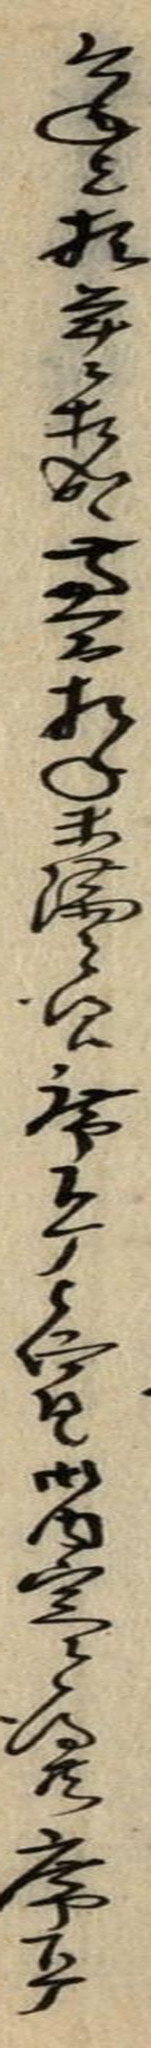今年迄拾年に相成候兼而拾年未満に候得は席下ケ被仰付候御内定に候得共席下ケ
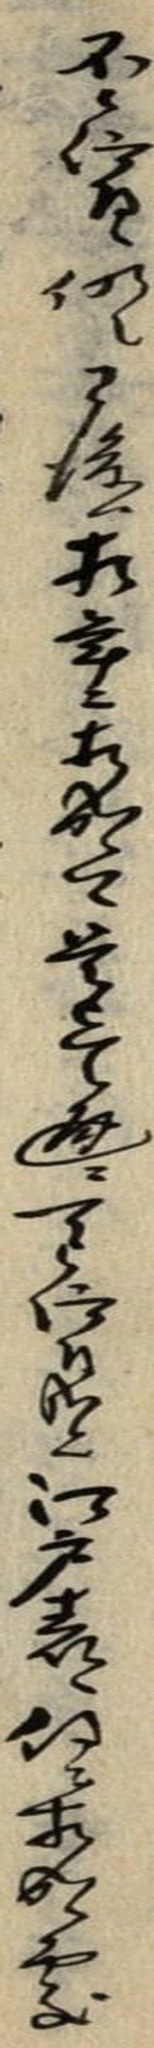不被仰付候仍之已後は拾年に相成候はゝ是迄之通に可被仰付哉と江戸表へ伺に相成候処
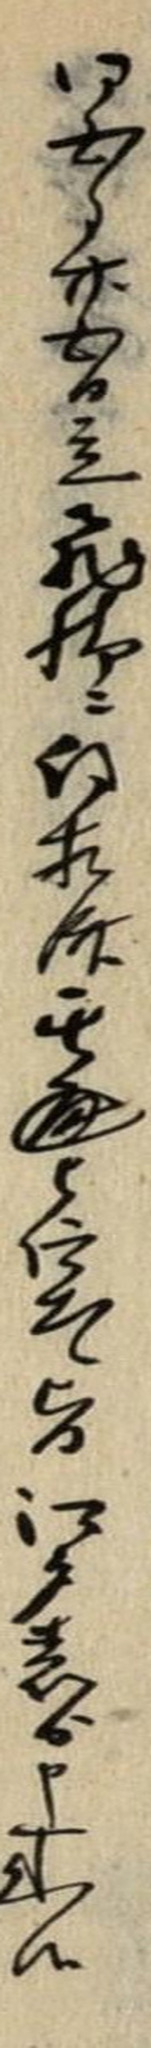同五月廿五日立飛脚に伺相済其通被仰出候旨江戸表ゟ申来候
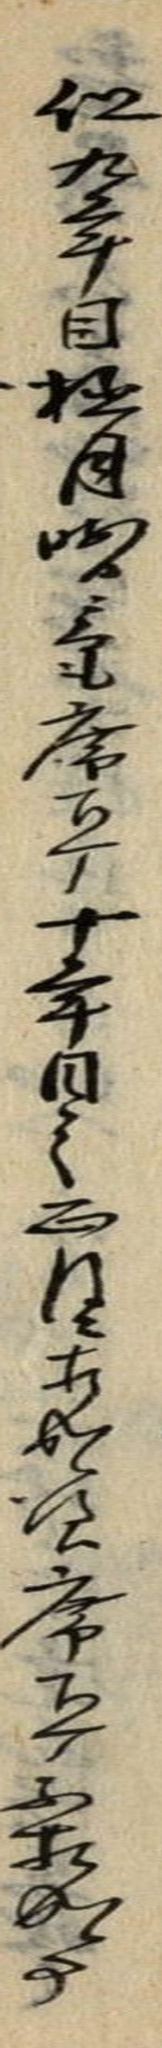但九年目極月晦日に而も席下ケ十年目之正月に相成候得は席下ケ不相成候事
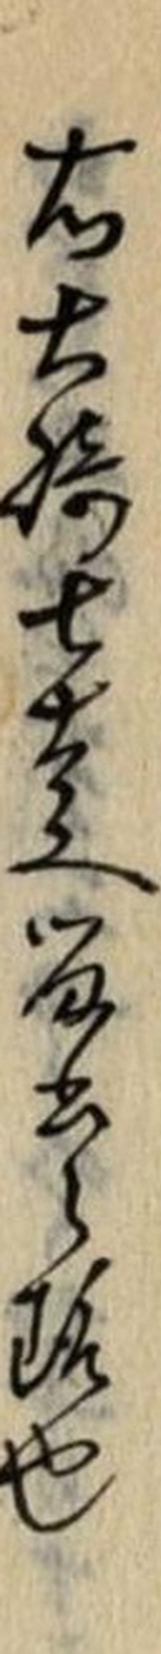右大崎七太夫留書之趣也
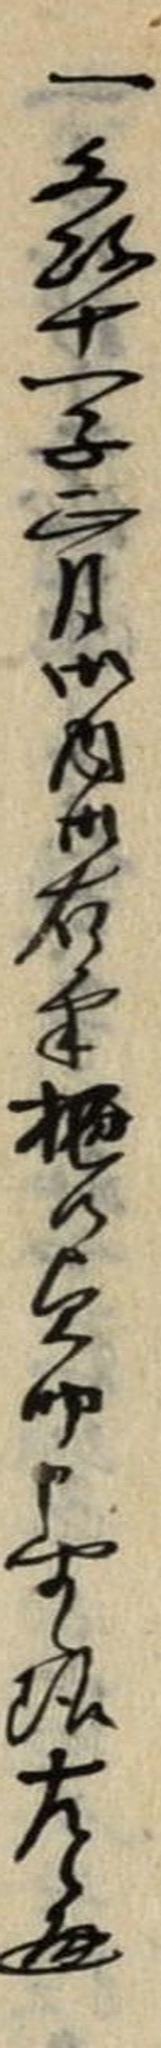一文政十一子正月御内御右筆樋口貞助申聞候趣左之通
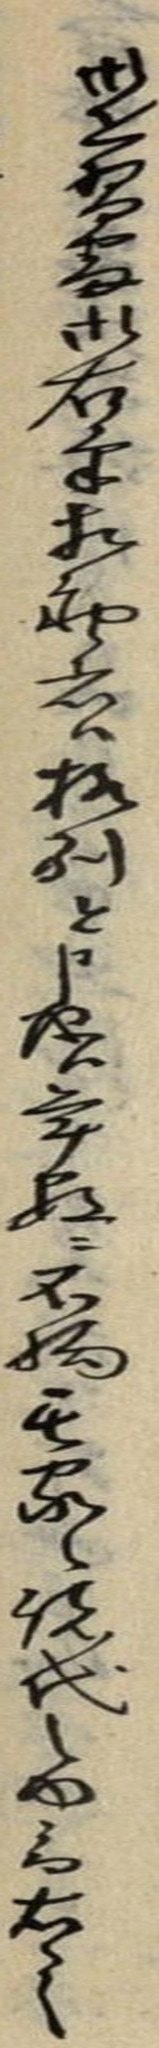御近習番御右筆相勤候者は格別と申儀は年数に不拘其家之諸代之内に而右之
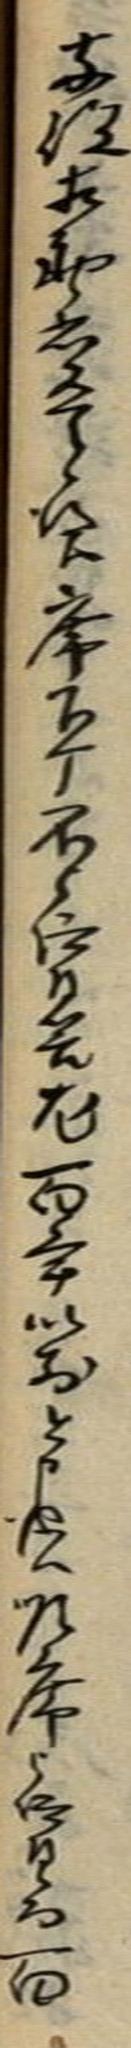両役相勤候者有之候得は席下ケ不被仰付候筈尤百年以前と申儀は順席被仰付候而百
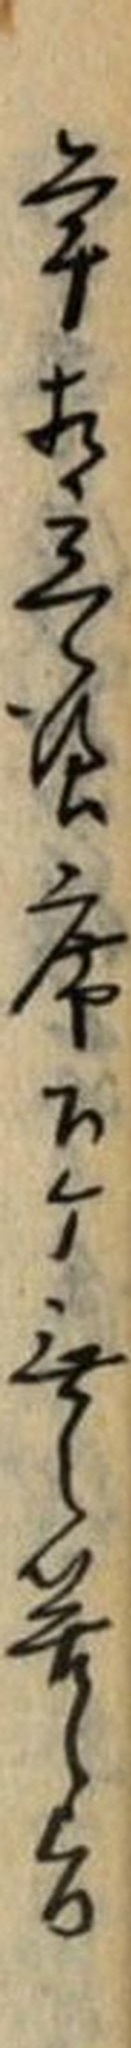年相立候得は席下ケ無之筈之旨
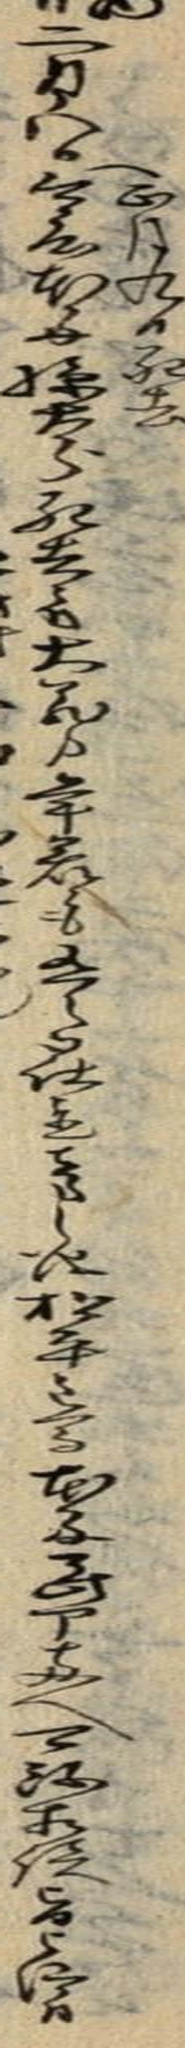一享保二酉二月八日今度本多孫太郎死去に付大蔵方年若にも有之御仕置旁之儀松平主馬本多民部両人可致相談旨被仰付
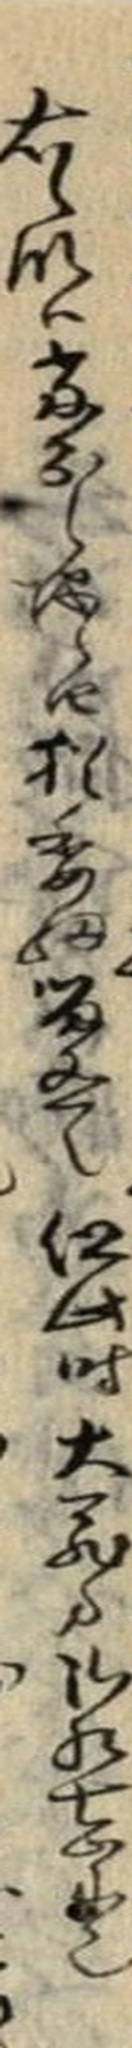右之段は当分之儀之由猶委細留有之但此時大蔵方弐拾七歳也
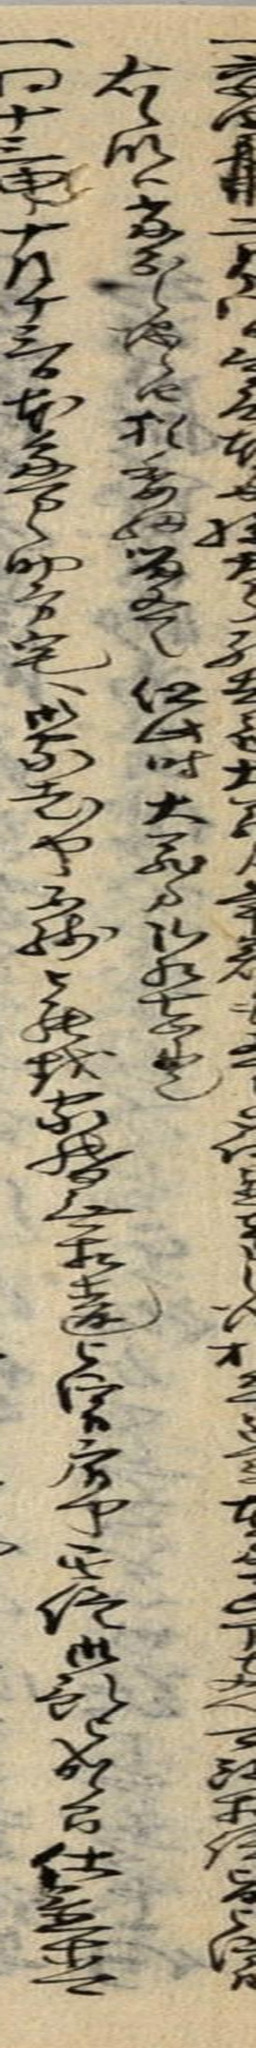一同十三申十月十三日本多万之助方宅へ御家老中不残被罷越家督無相違被仰付府中其侭御預被成候間仕置等可
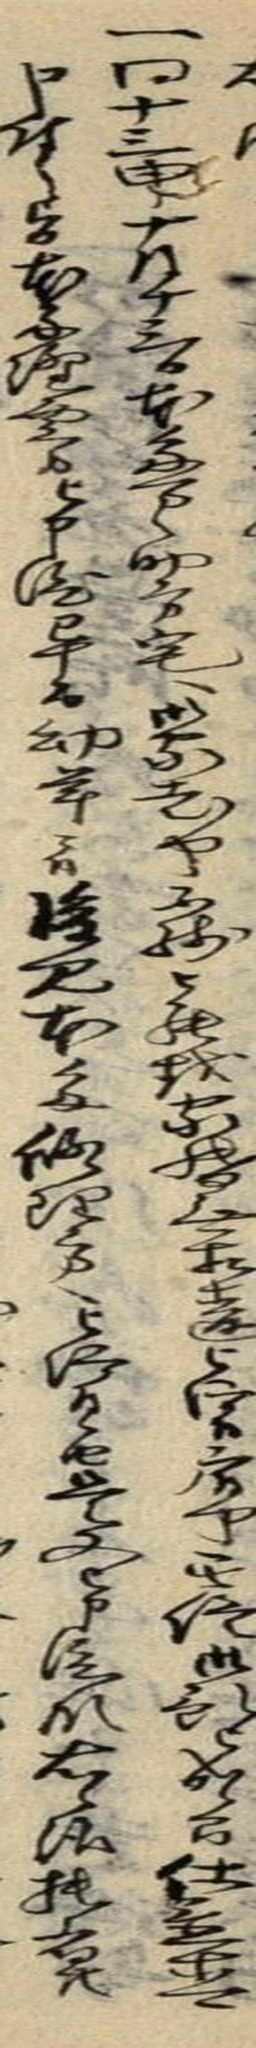申付候旨本多縫殿方被申渡畢而幼年に付後見本多修理方へ被仰付候由是又被申渡候段右之趣拙者共
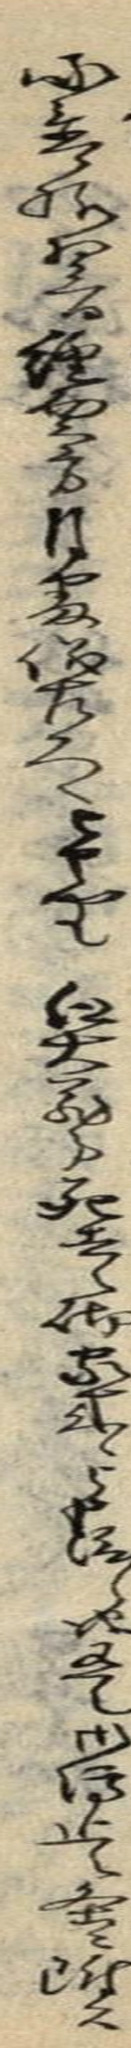承置候様翌日縫殿方月番儀左衛門へ被申聞候但大蔵方死去之砌家来へ被申渡之儀有之御停止之条に附す
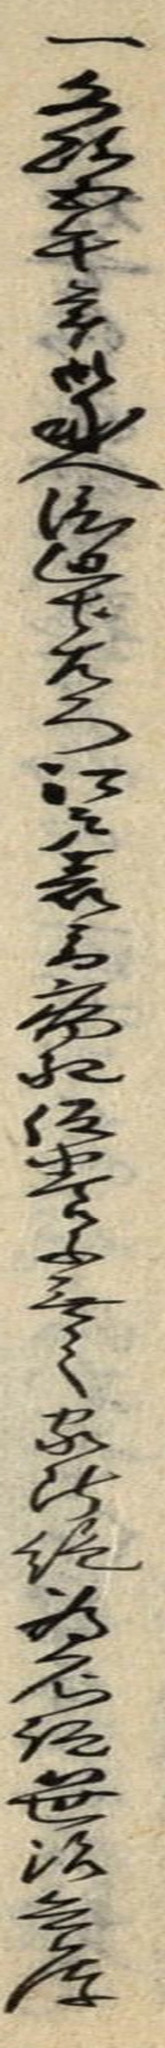一文政五午年御用人渡辺十郎左衛門江戸表に而病死仮養子無之家断絶為名跡笹治兵庫
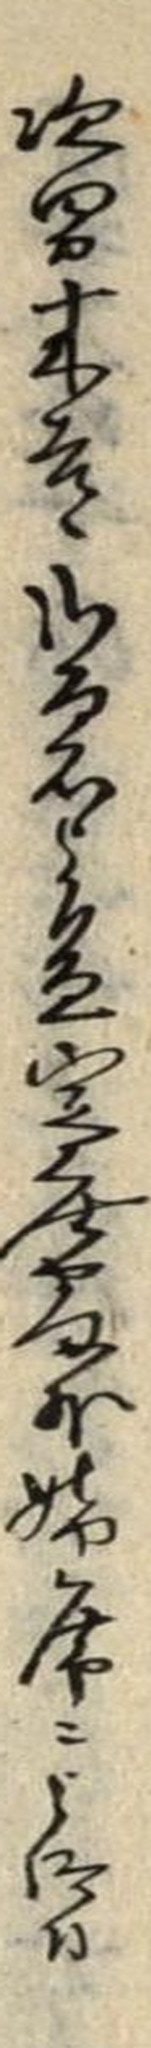次男来吉へ弐百石被下置定座番外嫡席に被仰付
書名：御用并被仰出之部
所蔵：福井県文書館 Fukui Prefectural Archives
